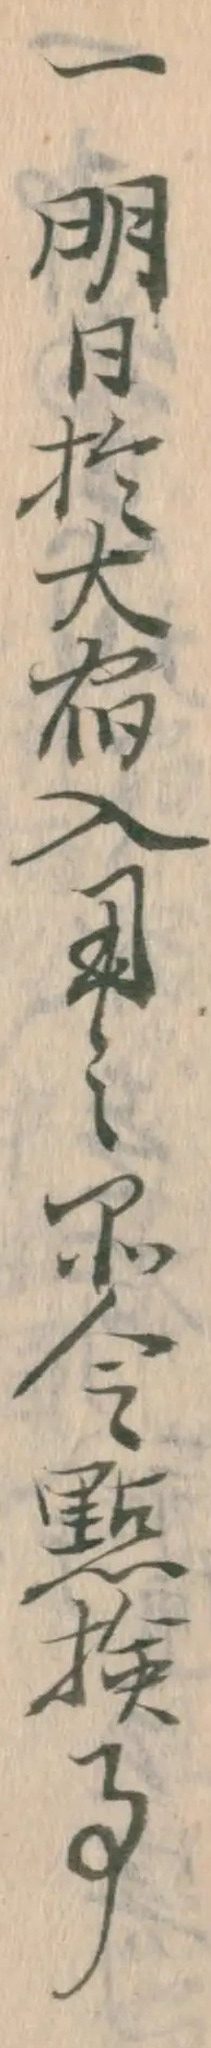一明日於大宿入用之品令点検事
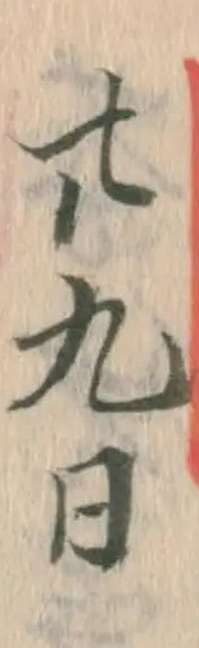廿九日
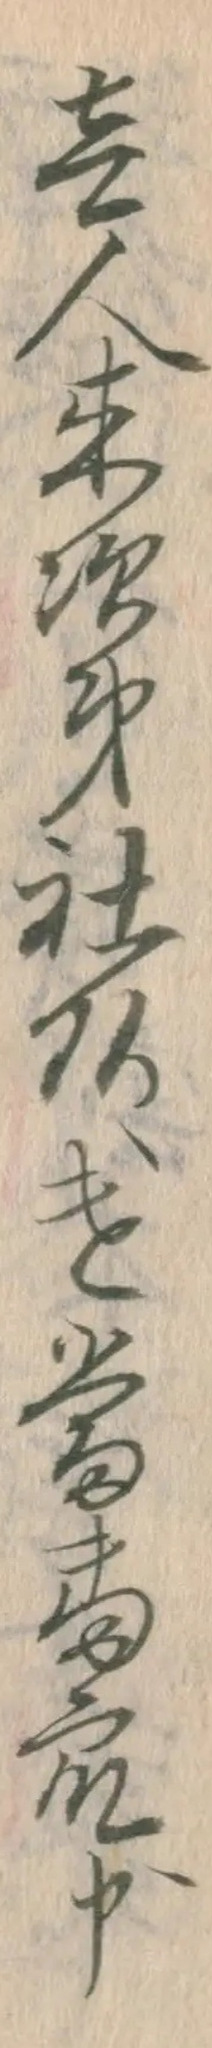壱人来次第社頭へ遣当番衆へ申
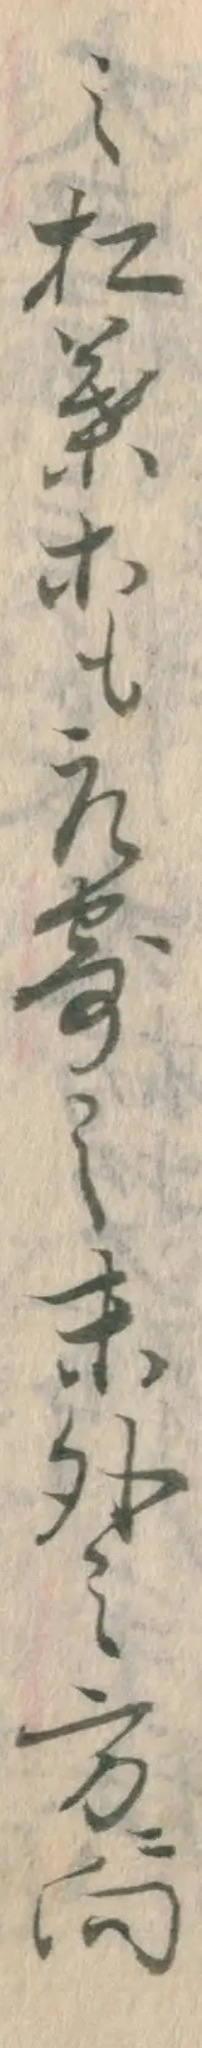之松葉等も取寄之末外之方に向
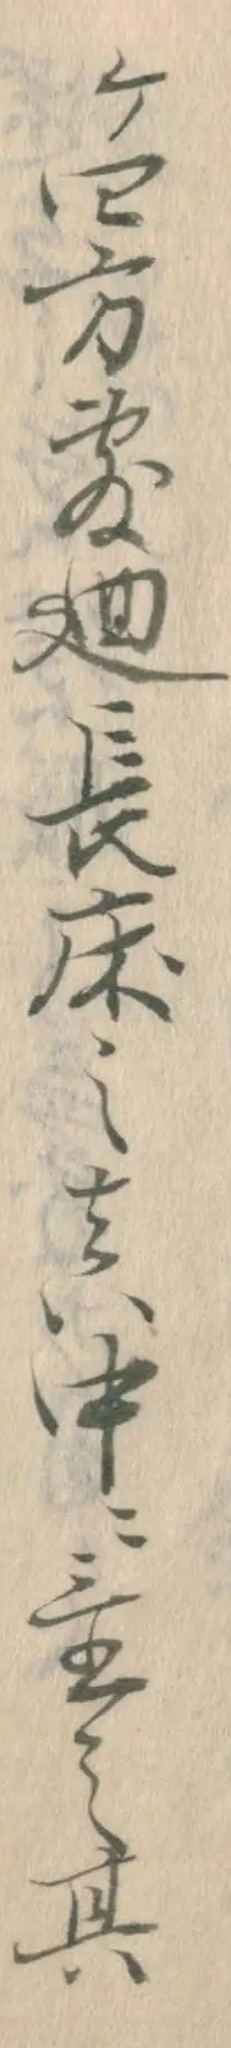ヶ四方敷廻長床之真中に置之其
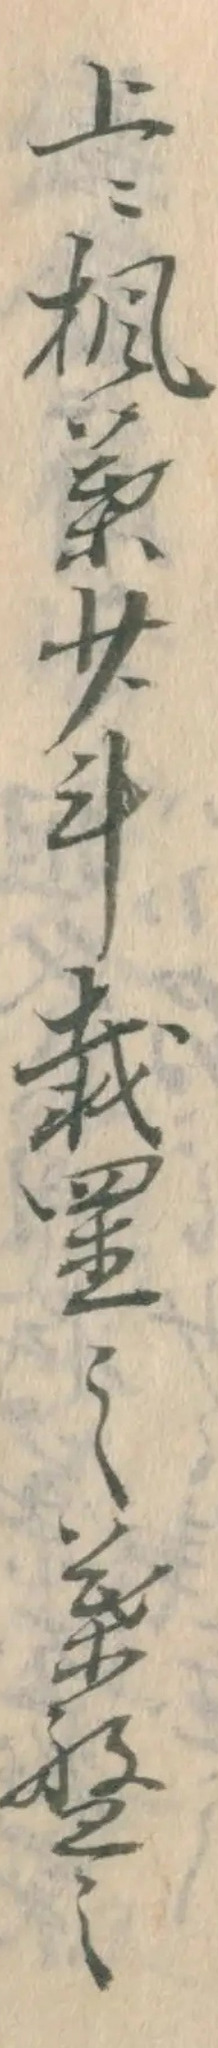上に楓葉少斗栽置之葉盤之

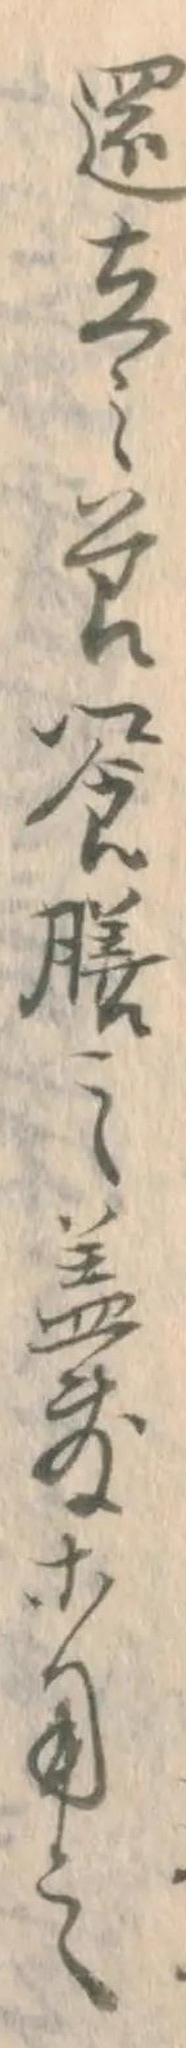還立之節饗膳之蓋敷等用之
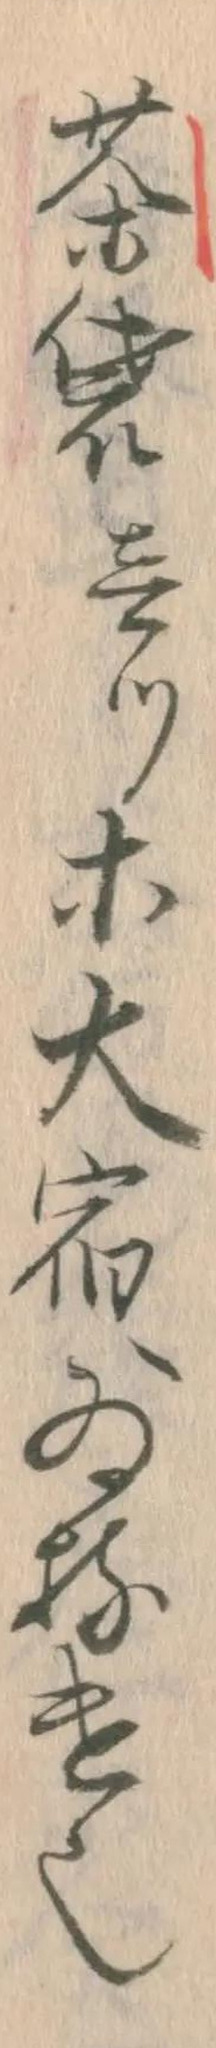茶袋壱ツ等大宿へ為持遣也
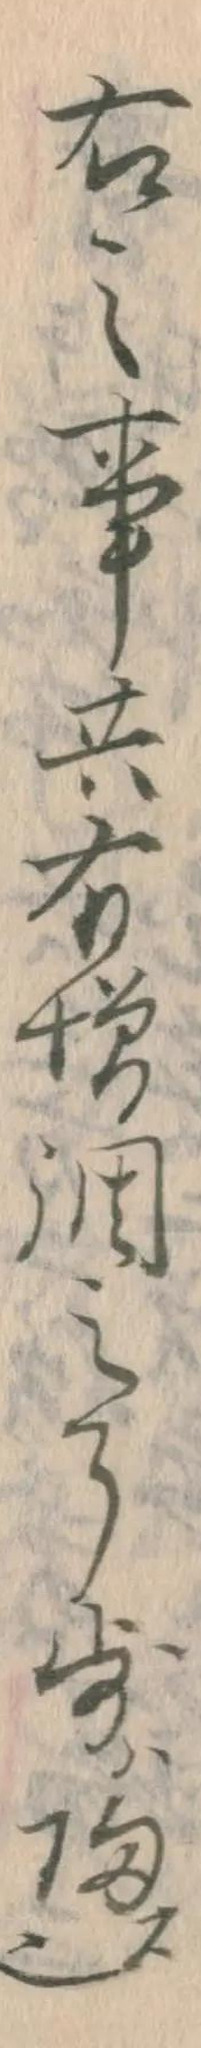右之事共有増調之了歩は帰す也
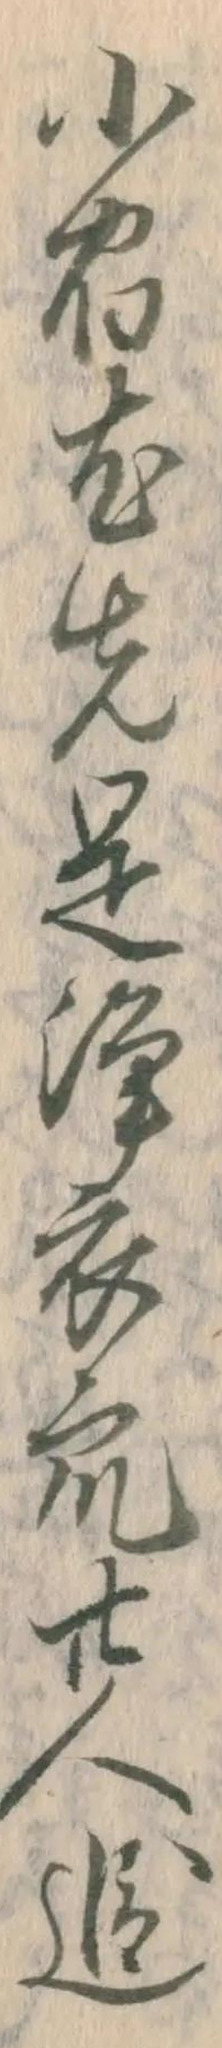小宿尤先是浄衣衆廿人へ追
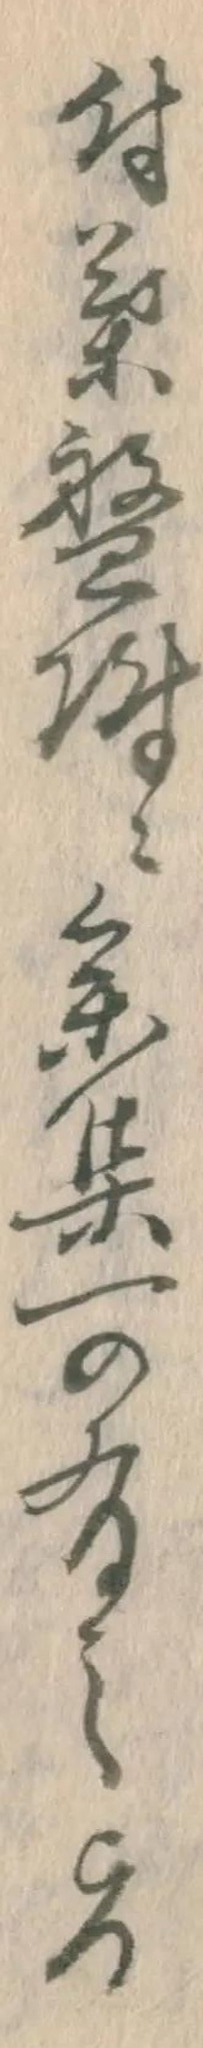付葉盤附に参集可有之旨
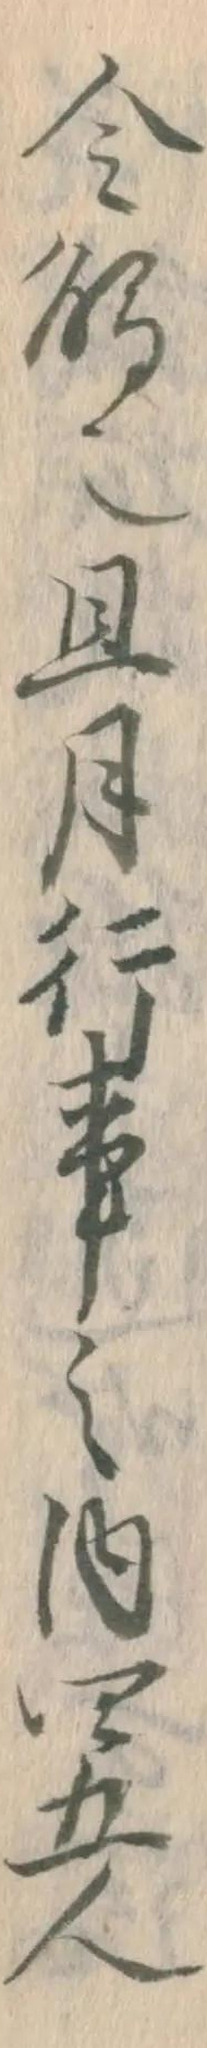令触也且月行事之内四五人
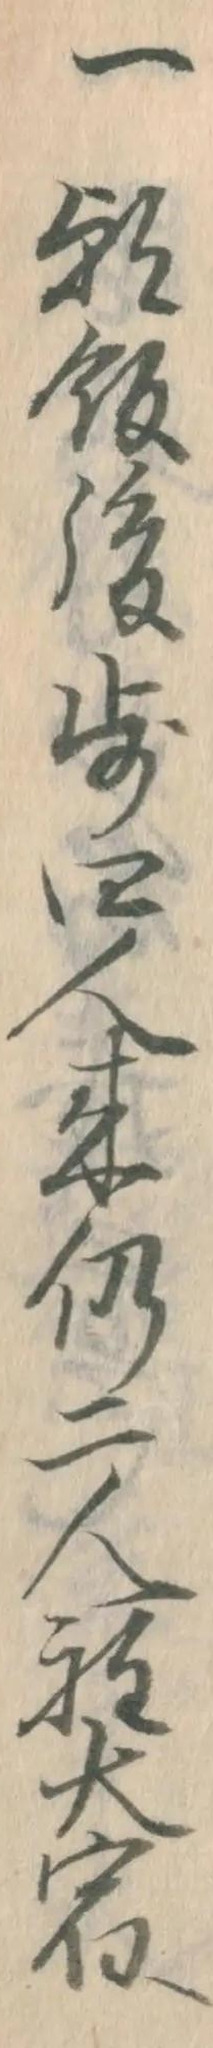一朝飯後歩四人来仍二人程大宿へ

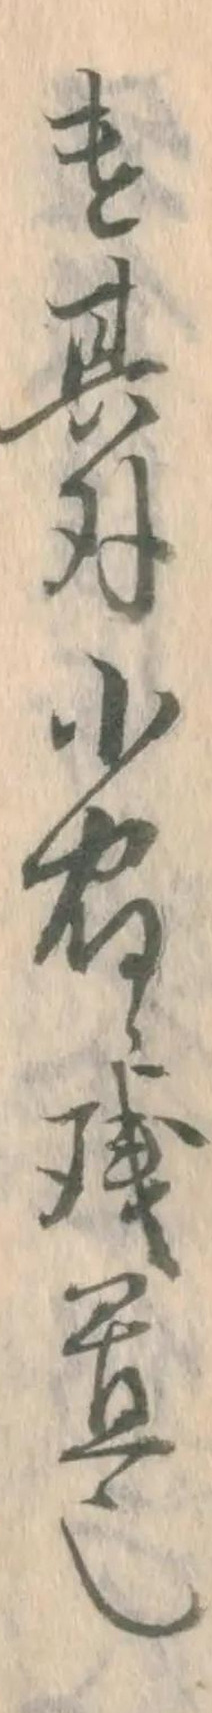遣其外小宿に残置也
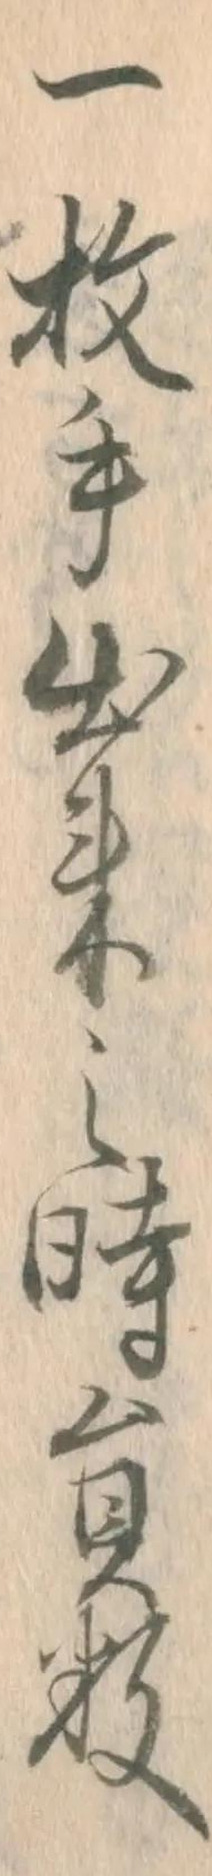一枚手出来之時員数
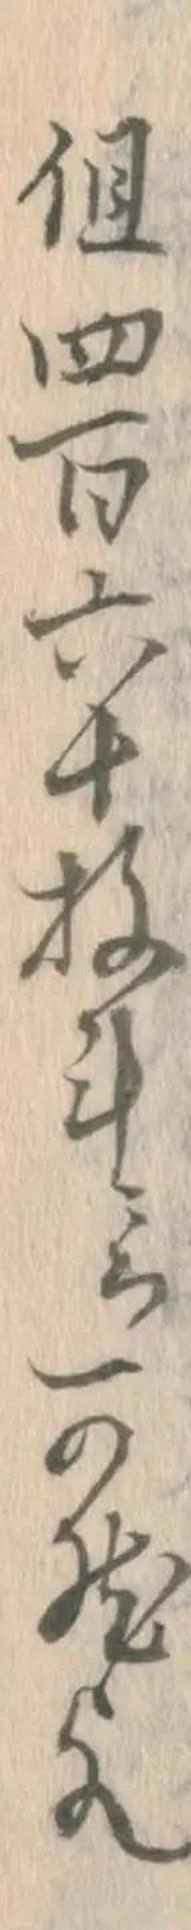但四百六十枚斗に而可然歟
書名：賀茂社記録. 第81冊
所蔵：国立国会図書館 National Diet Library, JAPAN
